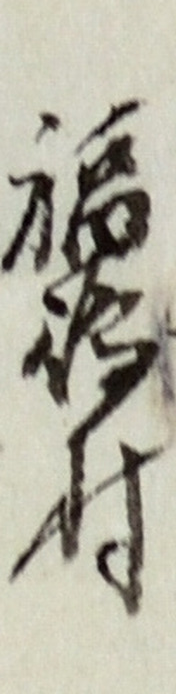飯嶋村
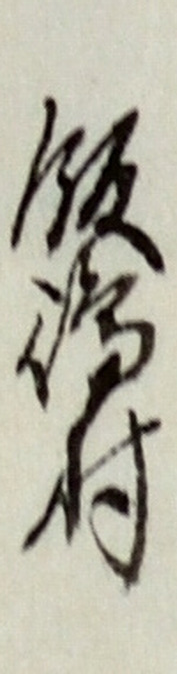飯嶋村

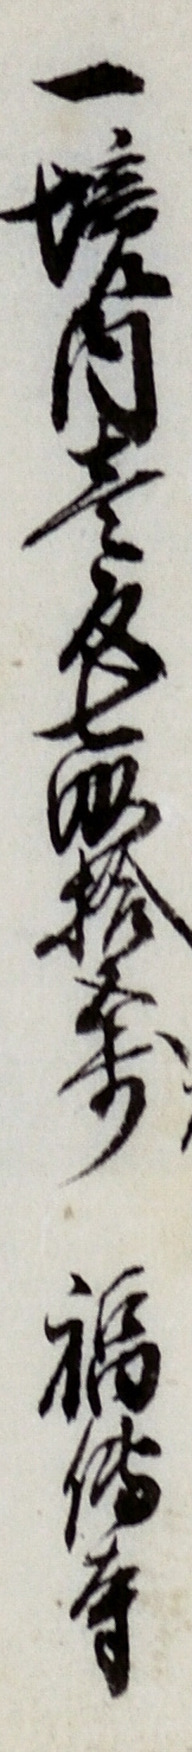一境内壱反七畝拾五歩福伝寺
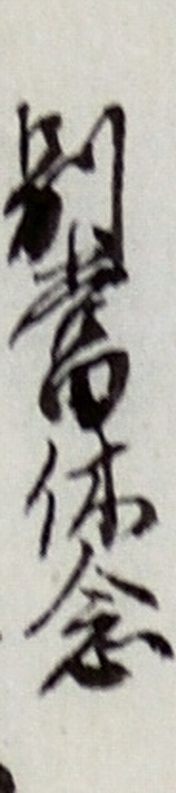別当休念
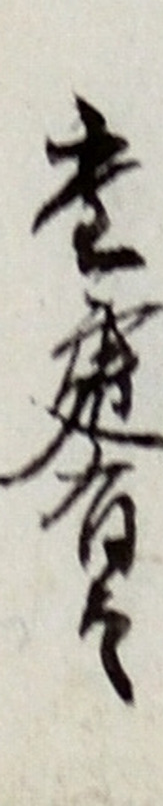堂建有之
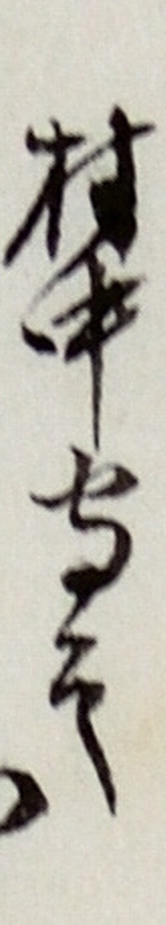村中守之
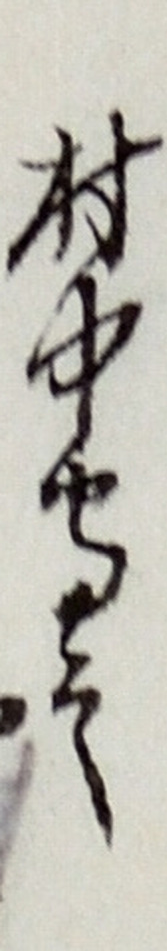村中守之
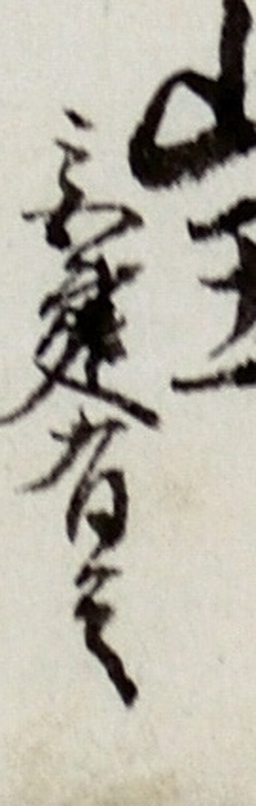宮建有之
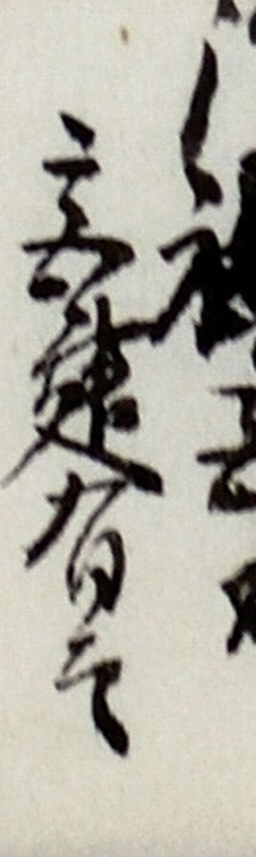宮建有之
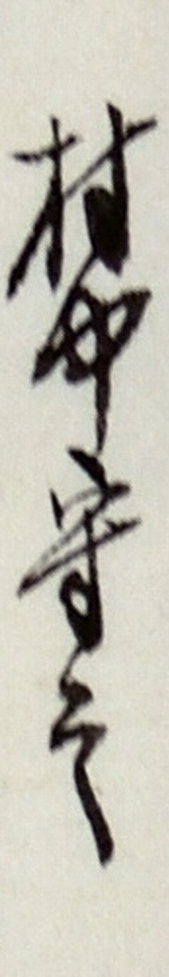村中守之
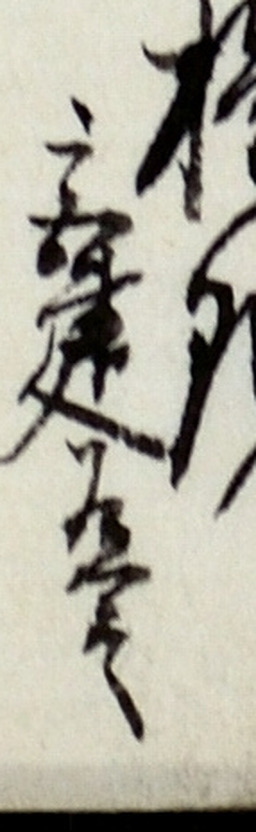宮建有之
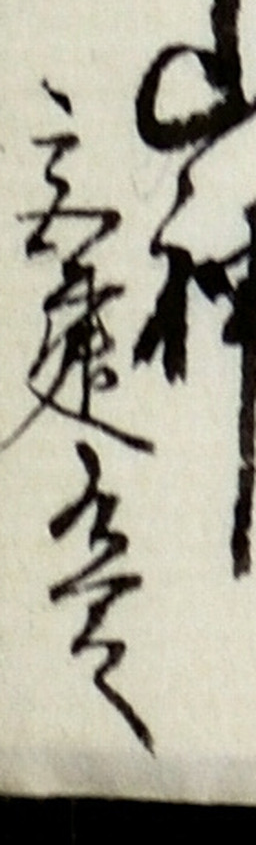宮建有之
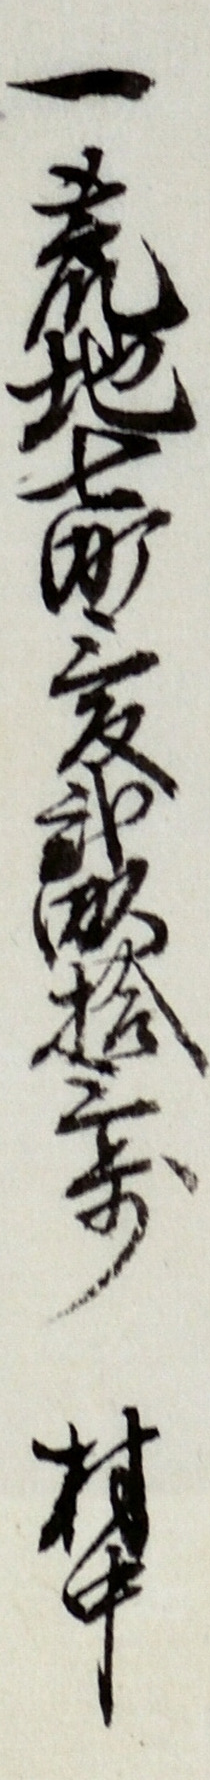一荒地七町三反弐畝拾三歩村中
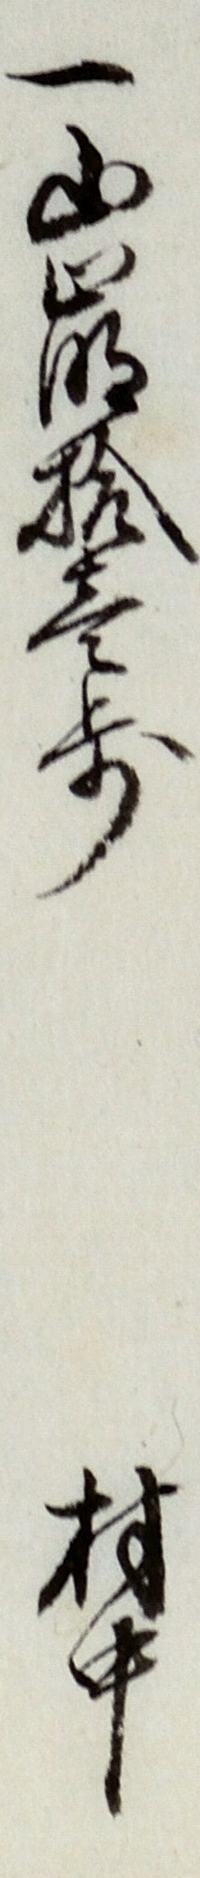一山崩拾壱歩村中

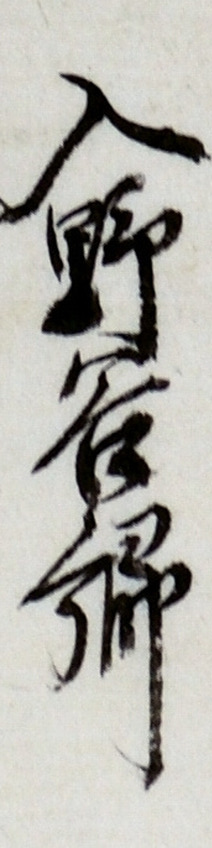入野谷郷
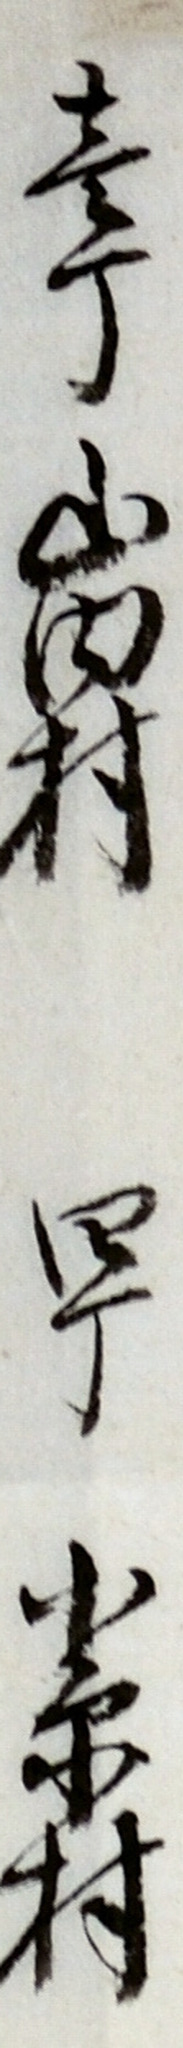壱丁山田村四丁小原村
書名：御領分中山林社地手控
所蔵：伊那市立高遠町図書館・合同会社AMANE
